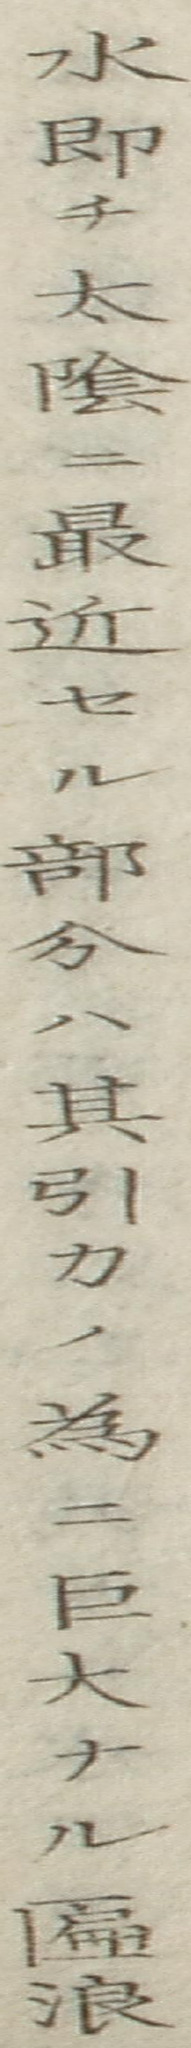水即チ太陰ニ最近セル部分ハ其引力ノ為ニ巨大ナル匾浪
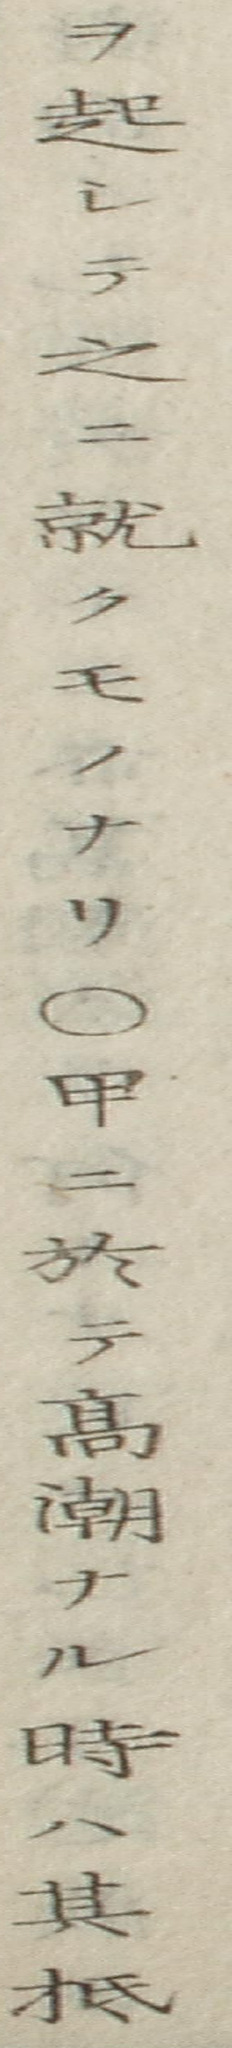ヲ起シテ之ニ就クモノナリ○甲ニ於テ高潮ナル時ハ其抵

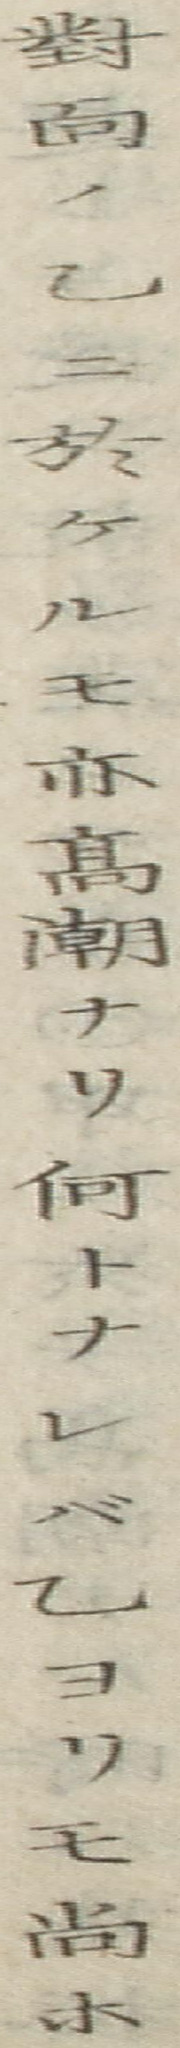対面ノ乙ニ於ケルモ亦高潮ナリ何トナレバ乙ヨリモ尚ホ
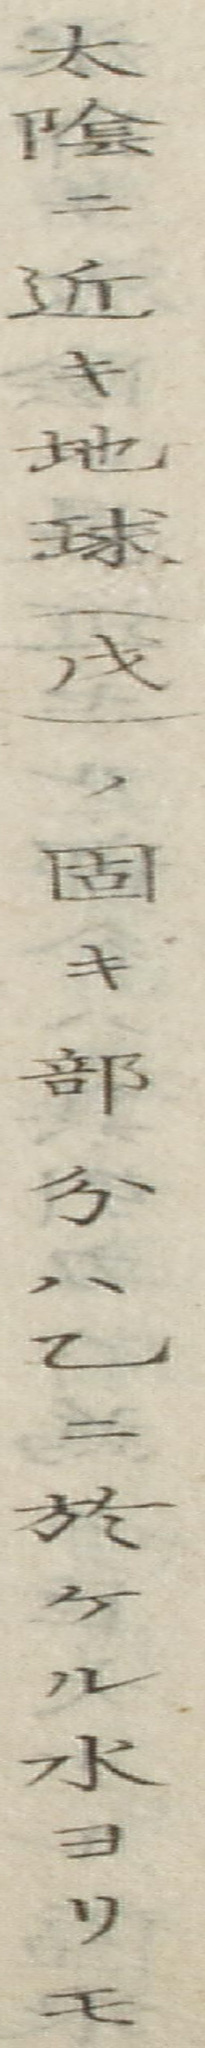太陰ニ近キ地球ノ固キ部分ハ乙ニ於ケル水ヨリモ
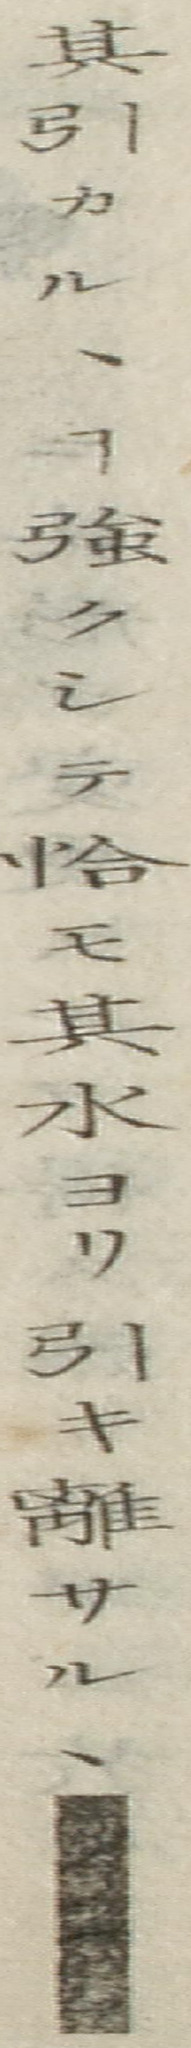其引カルヽヿ強クシテ恰モ其水ヨリ引キ離サルヽ
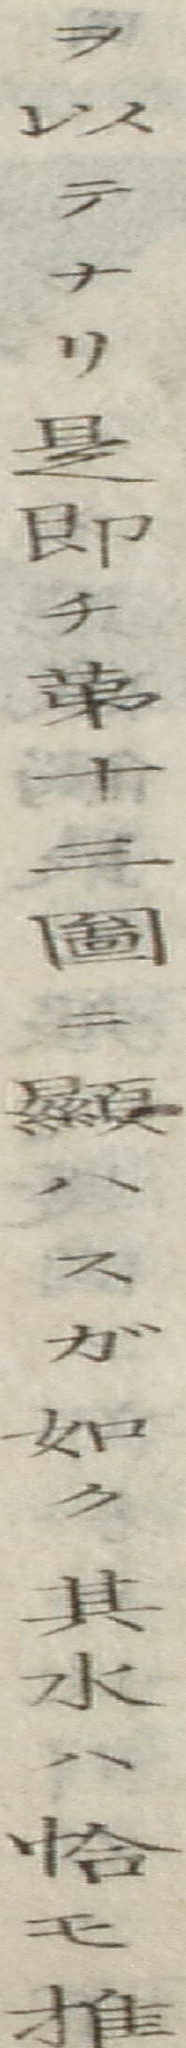ヲ以テナリ是即チ第十三図ニ顕ハスガ如ク其水ハ恰モ推
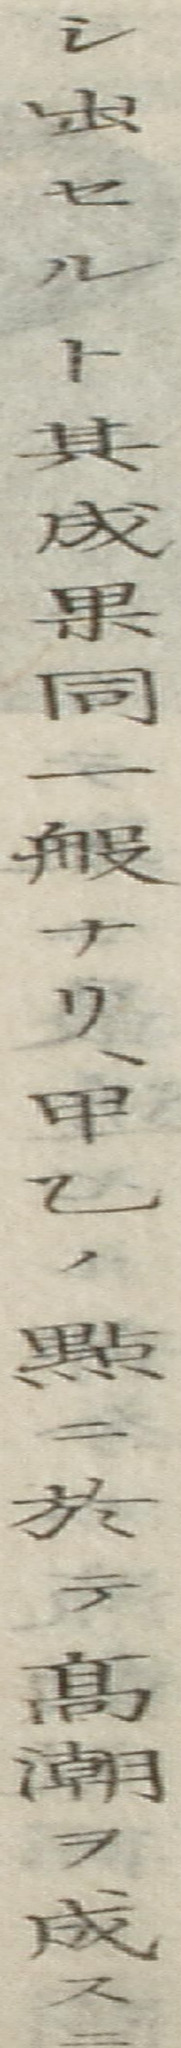シ出セルト其成果同一般ナリ、甲乙ノ点ニ於テ高潮ヲ成スニ
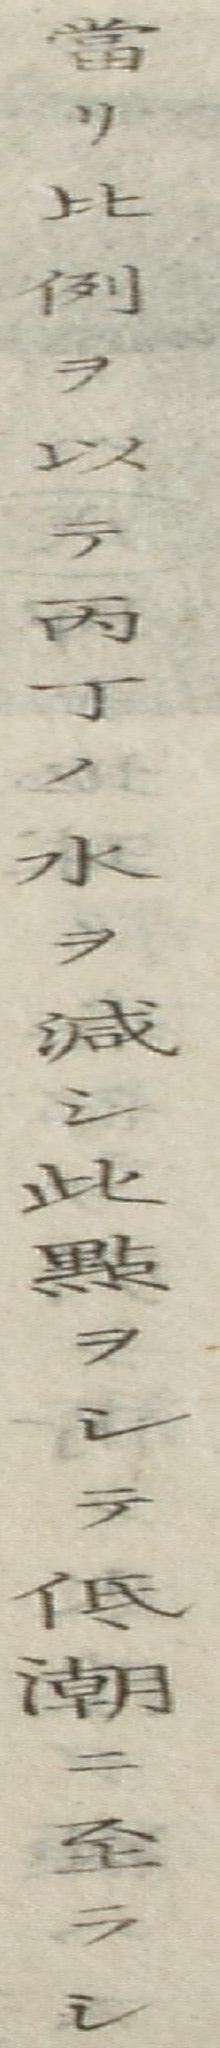当リ比例ヲ以テ丙丁ノ水ヲ減シ此点ヲシテ低潮ニ至ラシ
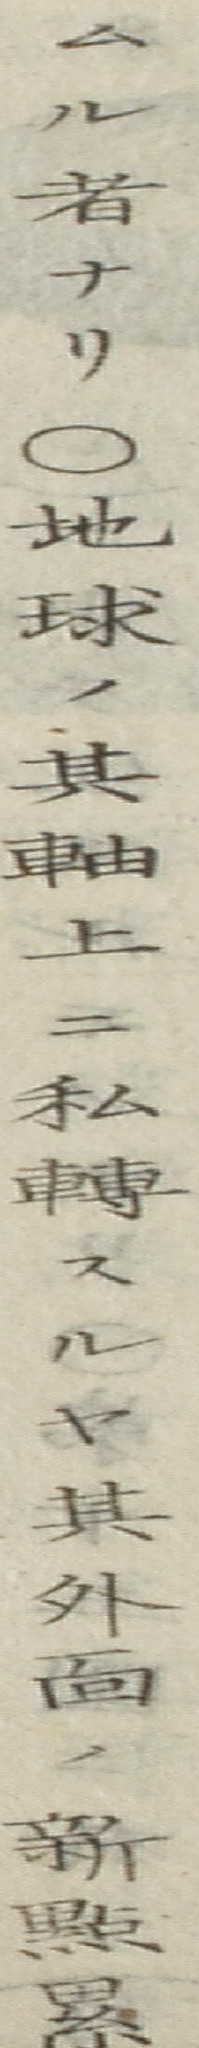ムル者ナリ○地球ノ其軸上ニ私転スルヤ其外面ノ新点累
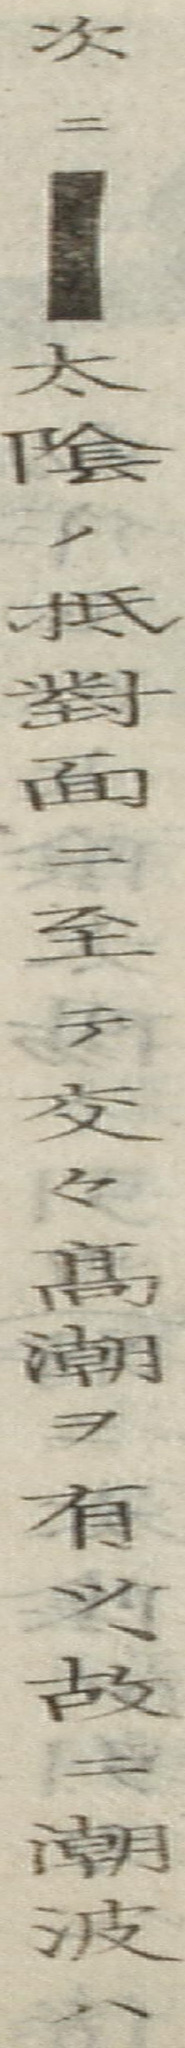次ニ太陰ノ抵対面ニ至テ交々高潮ヲ有ツ、故ニ潮波ハ
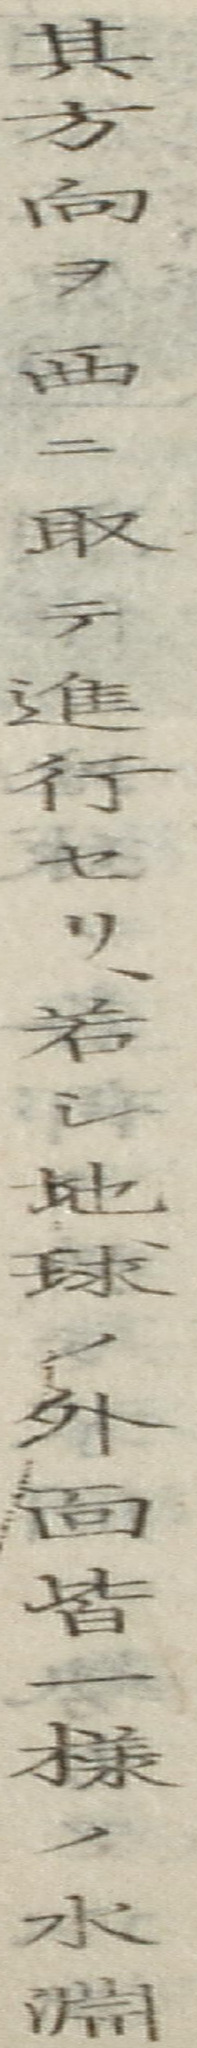其方向ヲ西ニ取テ進行セリ、若シ地球ノ外面皆一様ノ水淵
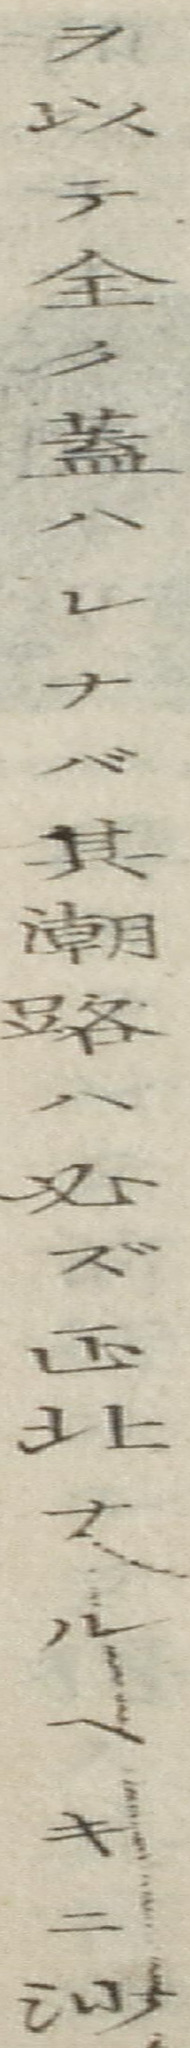ヲ以テ全ク蓋ハレナバ其潮路ハ必ズ正北ナルヘキニ沙
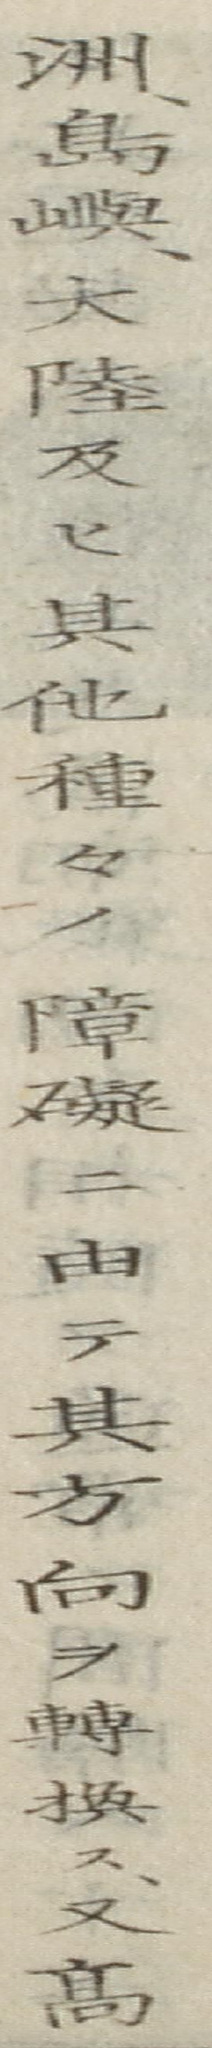洲、島嶼、大陸及ヒ其他種々ノ障礙ニ由テ其方向ヲ転換ス、又高
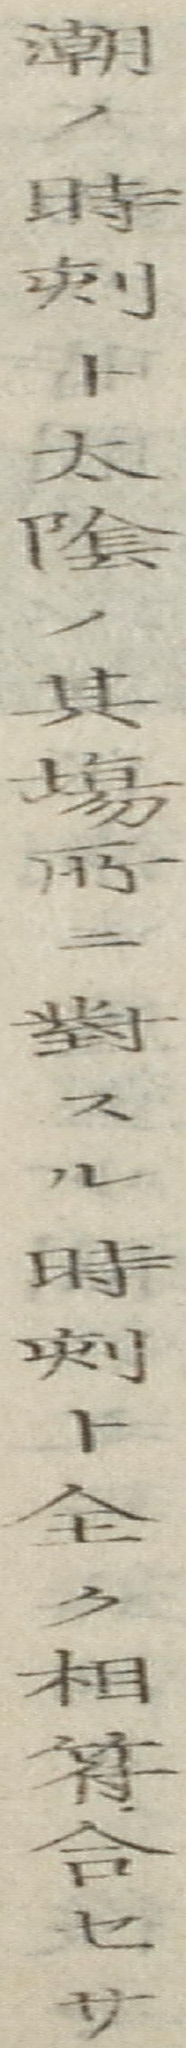潮ノ時刻ト太陰ノ其場所ニ対する時刻ト全ク相符合セサ
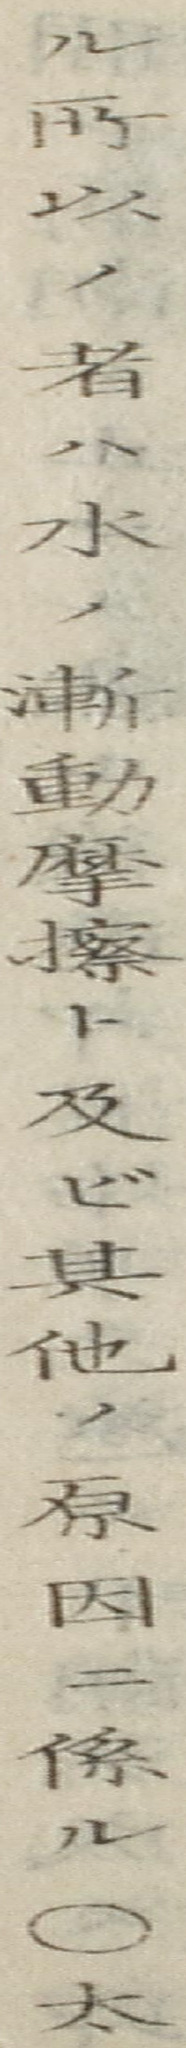ル所以ノ者ハ水ノ漸動摩擦ト及ビ其他ノ原因ニ係ル○太
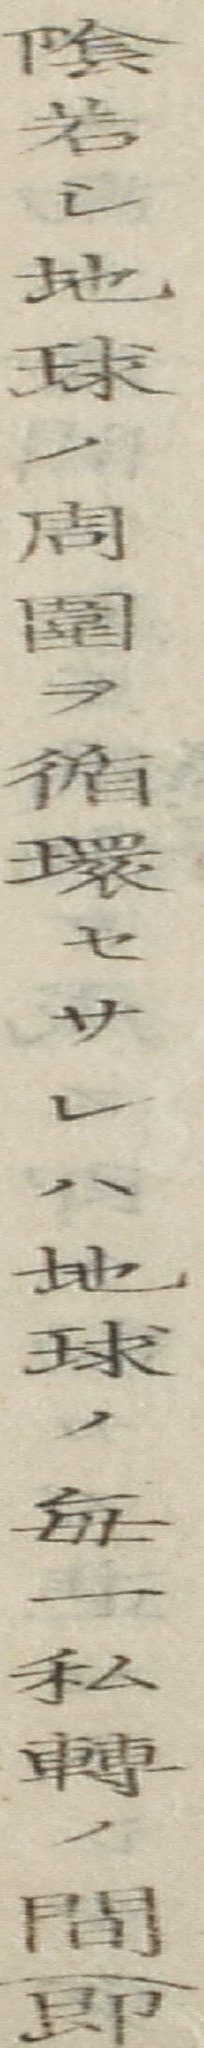陰若シ地球ノ周囲ヲ循環セサレハ地球ノ毎一私転ノ間（即
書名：地形論　巻二
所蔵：東京大学地震研究所図書室 Earthquake Research Institute Library, The University of Tokyo, JAPAN
